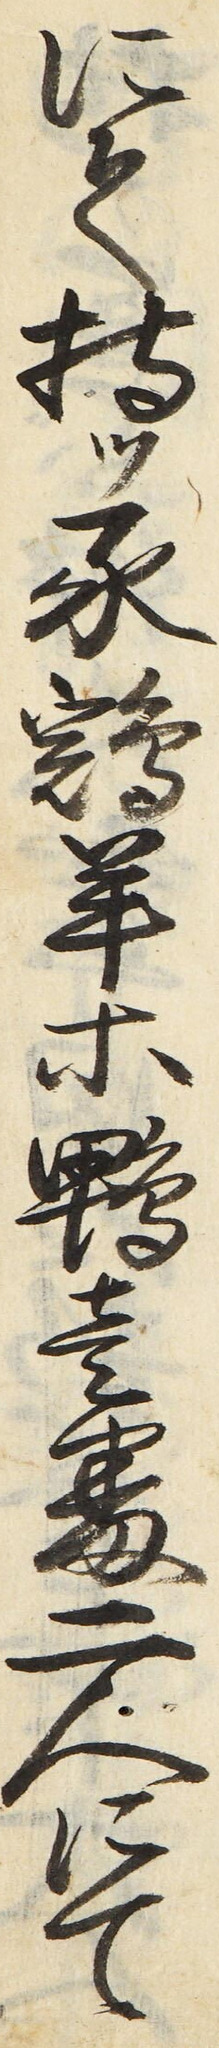にて持つ豕鶏羊等鴨壱番二人にて

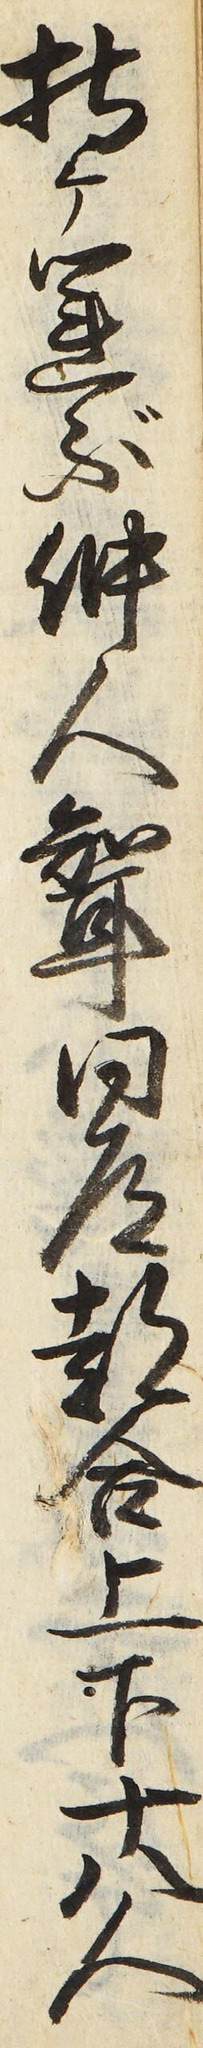持ち運ぶ仲人聟同道都合上下十八人
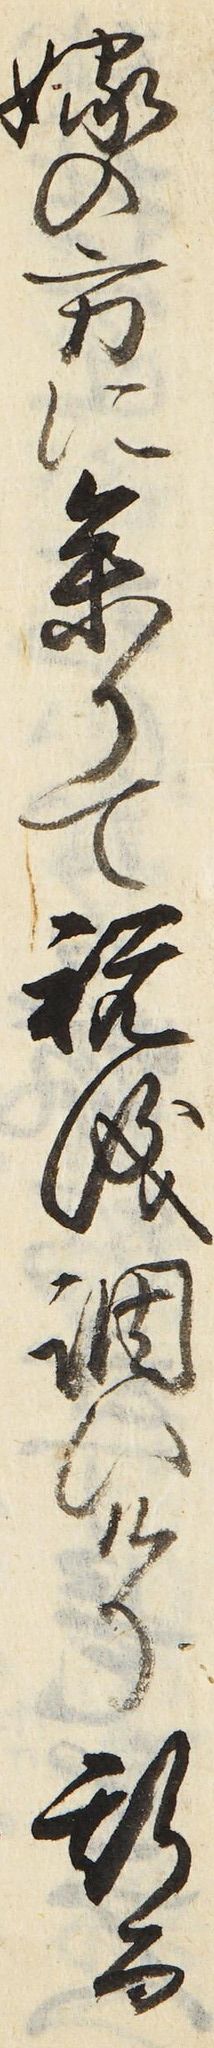嫁の方に参りて祝儀調ひけり斯而
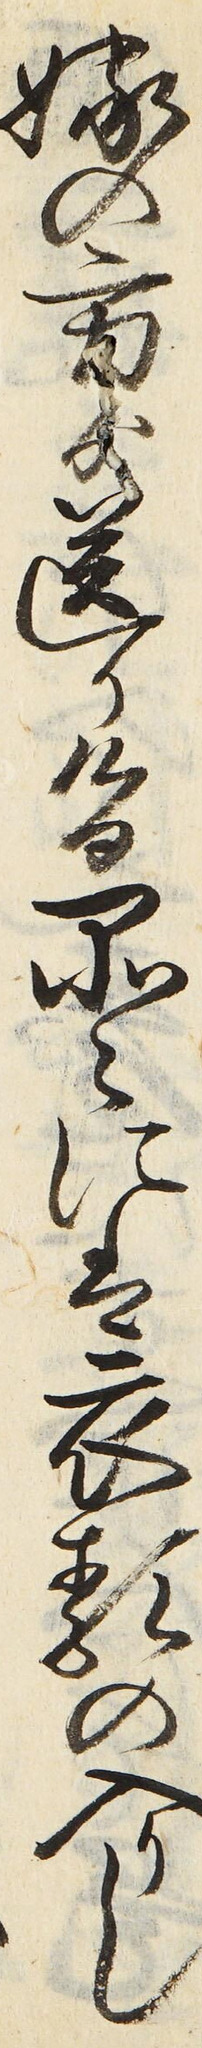嫁之方ゟ送りける品々には衣類の入りし
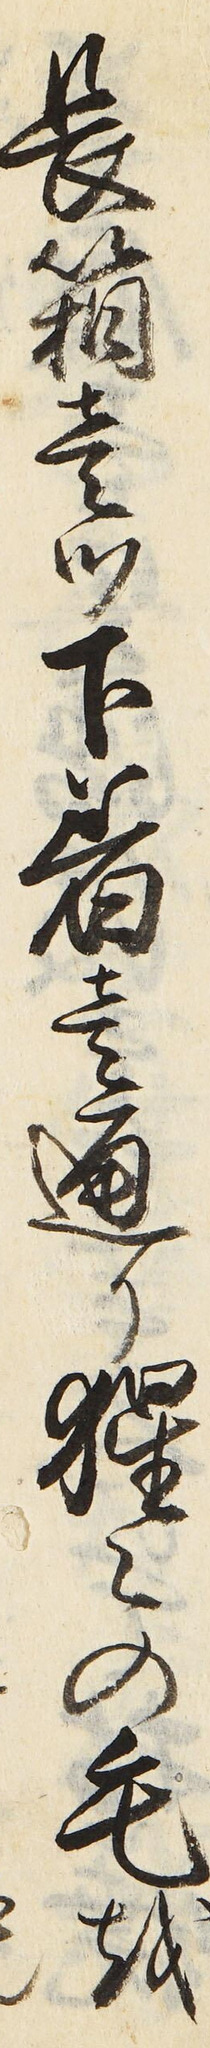長箱壱ツ下着壱通り猩々の毛を
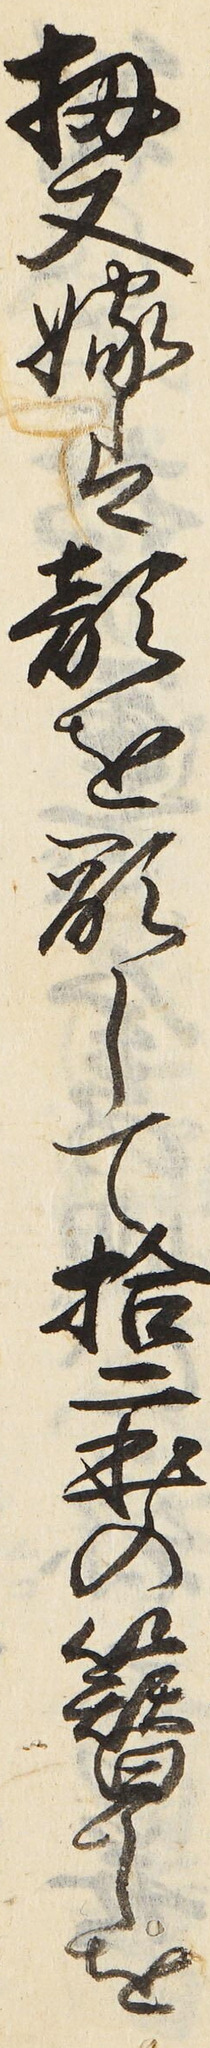扨又嫁は顔を顕して拾二本の簪しを
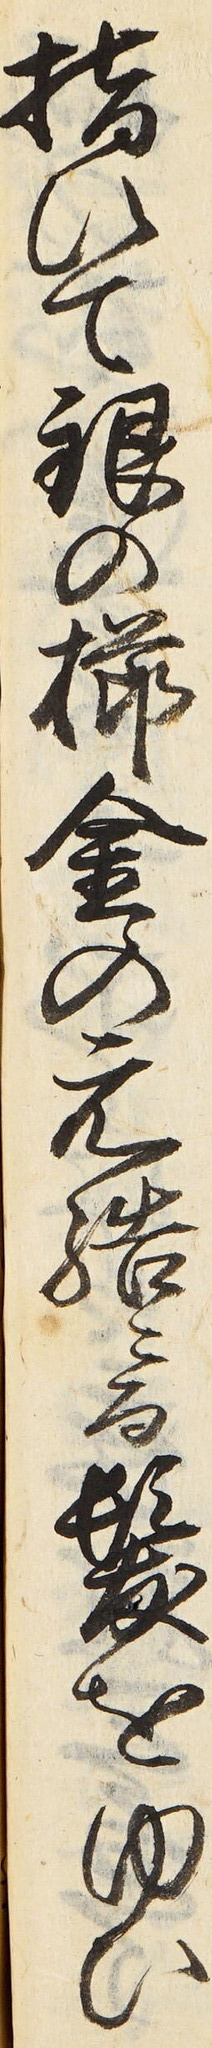指ひて銀の櫛金の元結に而髪をゆひ
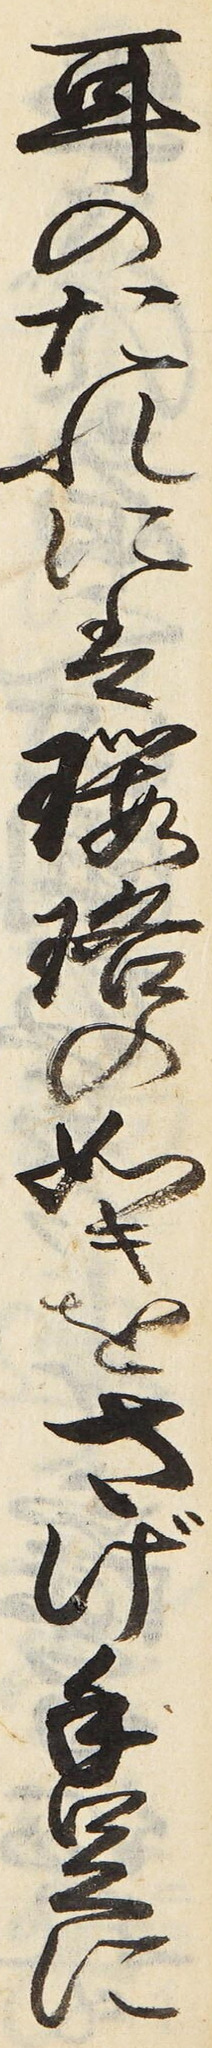耳のたれには瓔珞の如きをさげ手足に
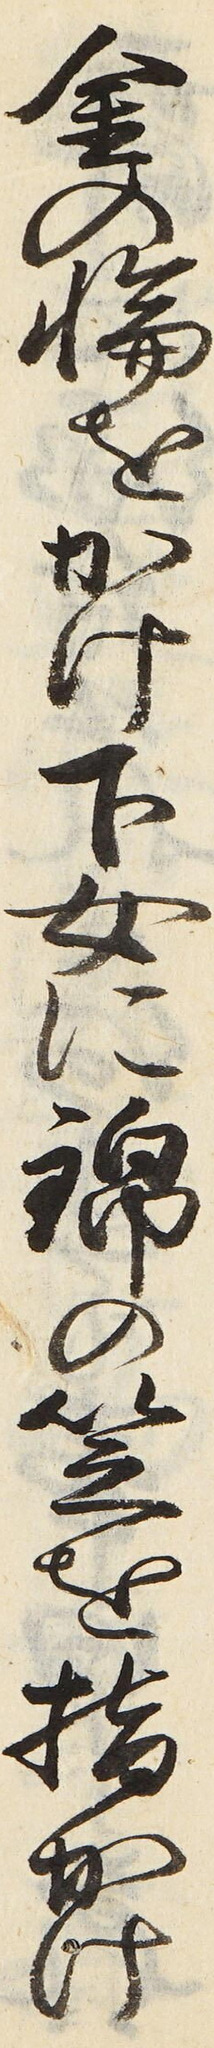金の輪をかけ下女に錦の笠を指かけ
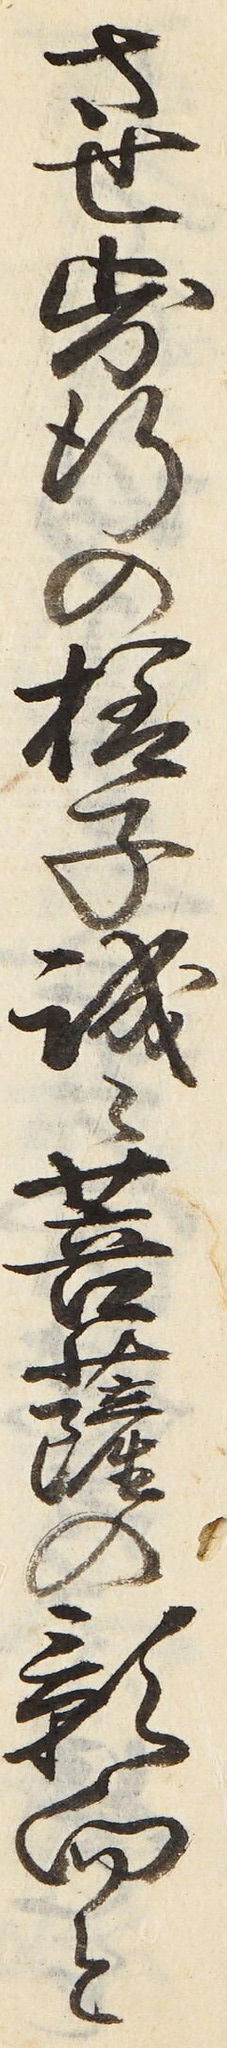させ歩行の様子誠に菩薩の影向と
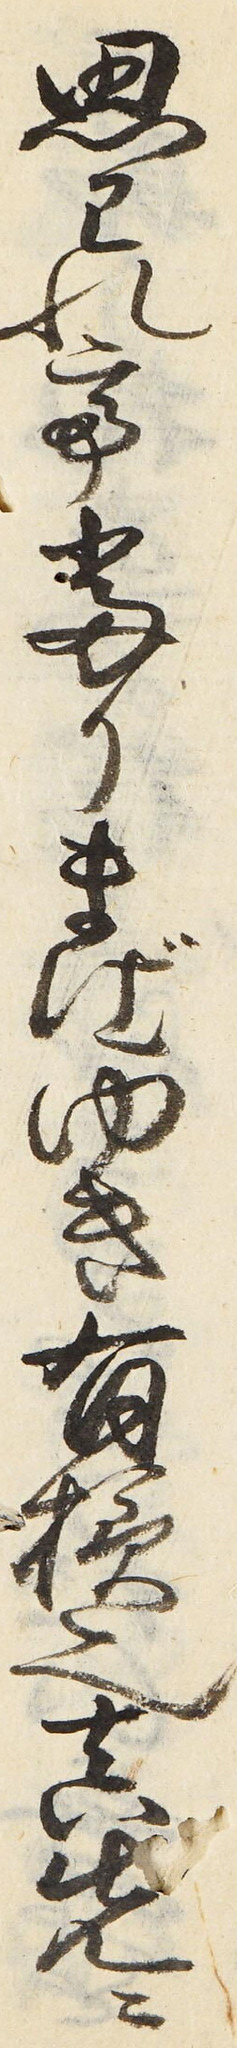思われて当りまばゆき有様也真先に
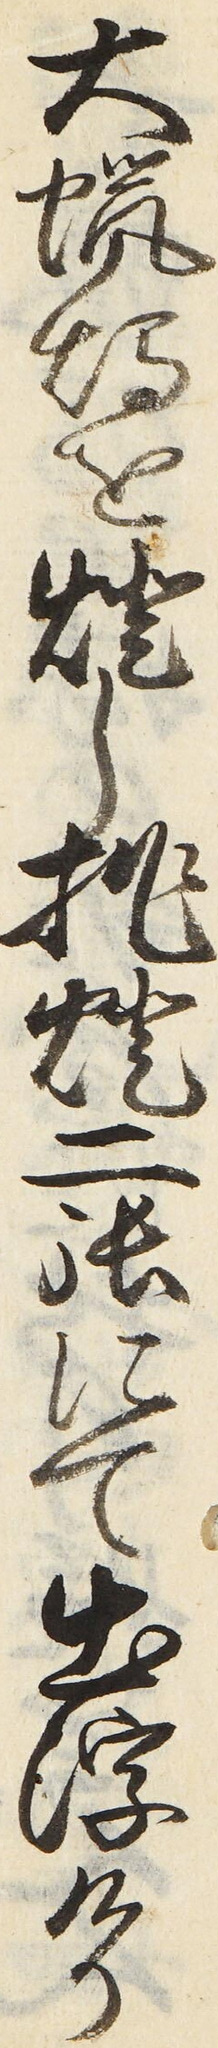大蝋燭を燈し挑燈二張にて出浮けり
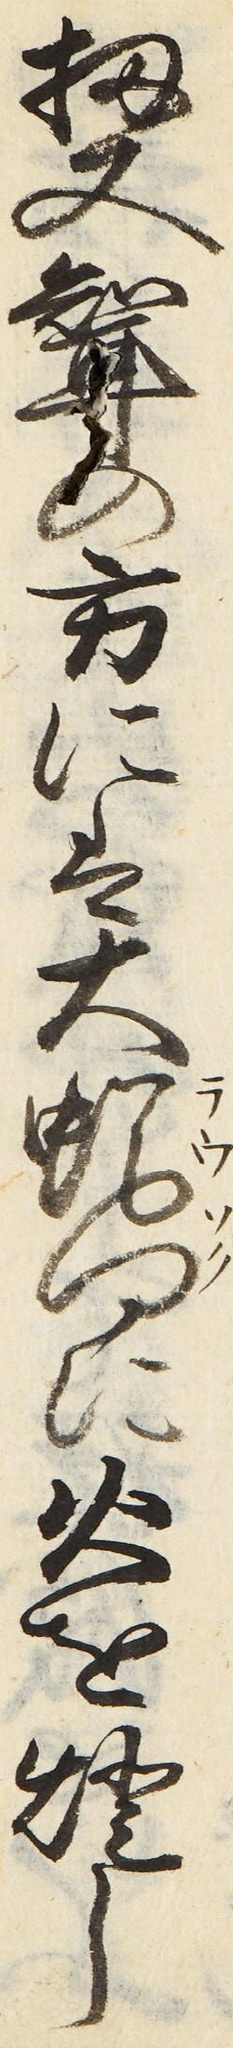扨又聟の方には大蝋燭に火を燈し
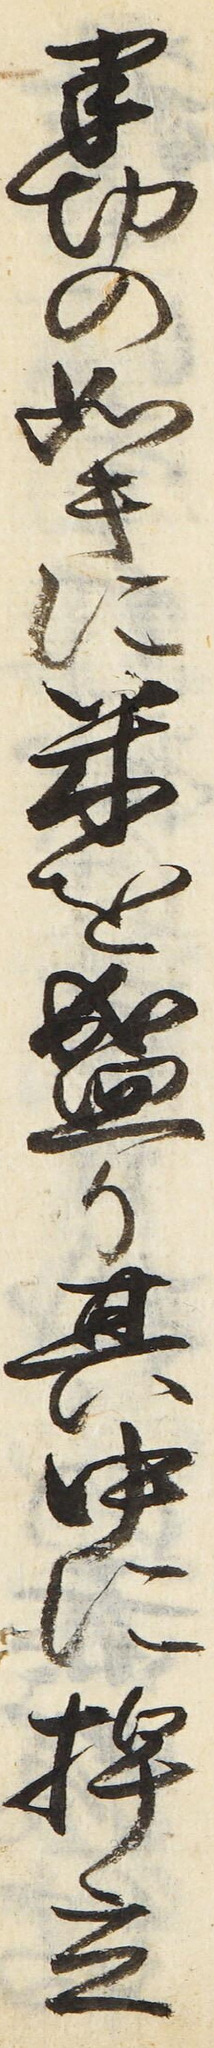半切の如きに米を盛り其中に棹立
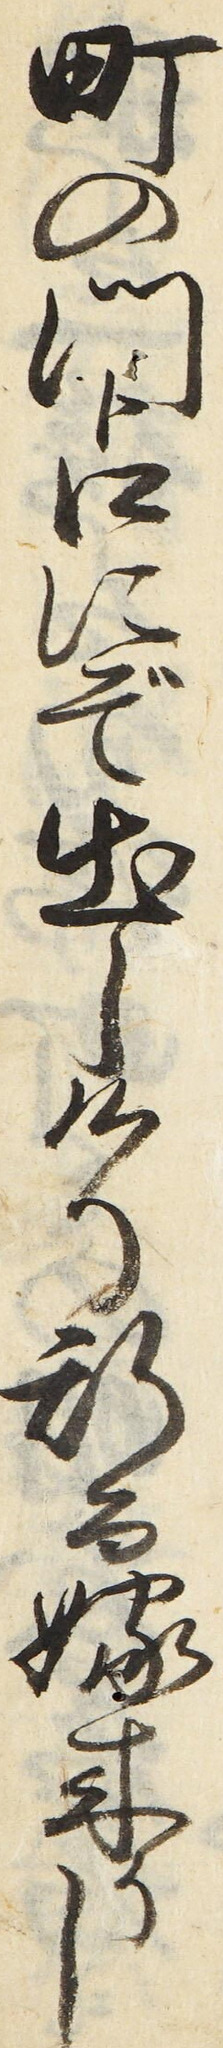町の門と口にぞ出しけり斯而嫁来りし

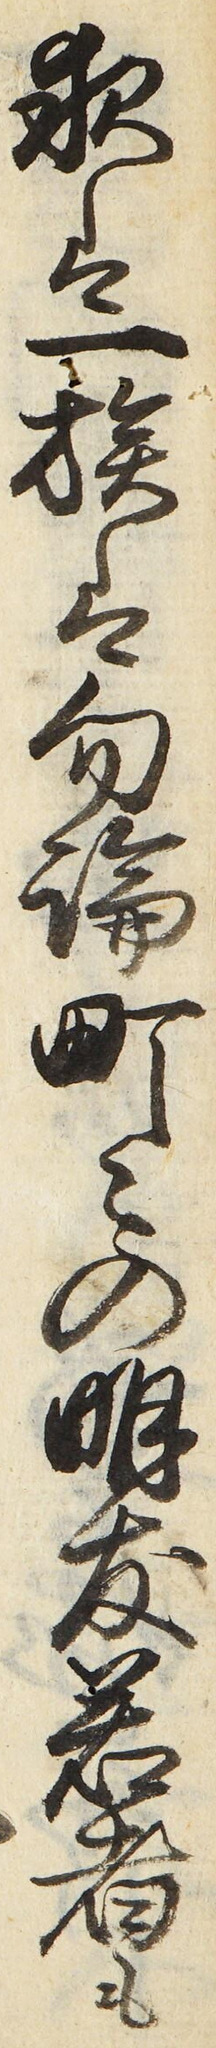夜は一族は勿論町々の朋友若者も
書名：華夷九年録
